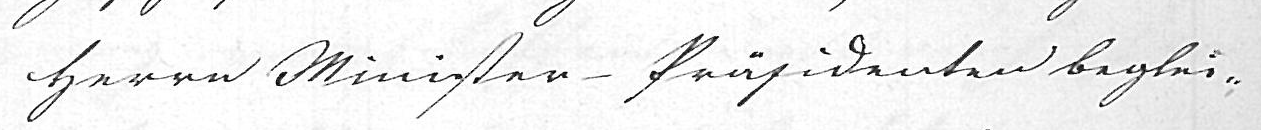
Herrn Minister-Präsidenten beglei-
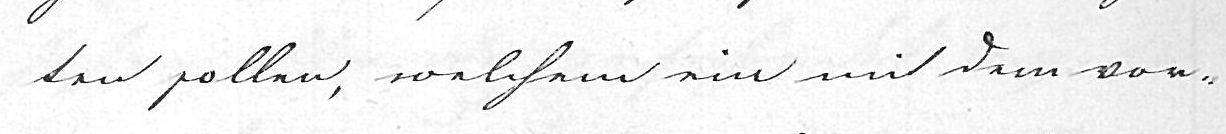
ten sollen, welchem ein mit dem vor-
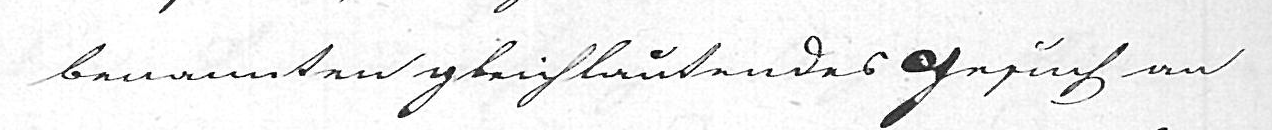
benannten gleichlautendes Gesuch an
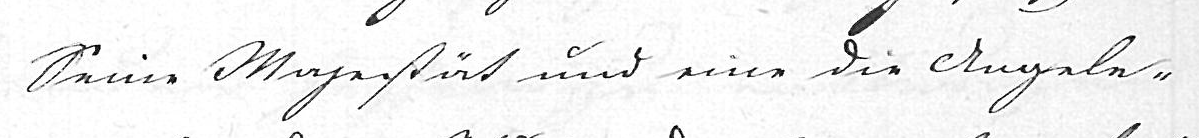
Seine Majestät und eine die Angele-
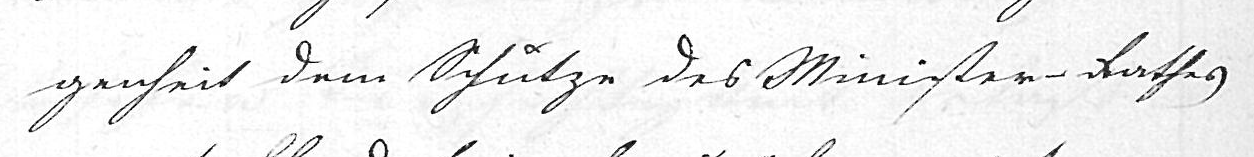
genheit dem Schutze des Minister-Rathes
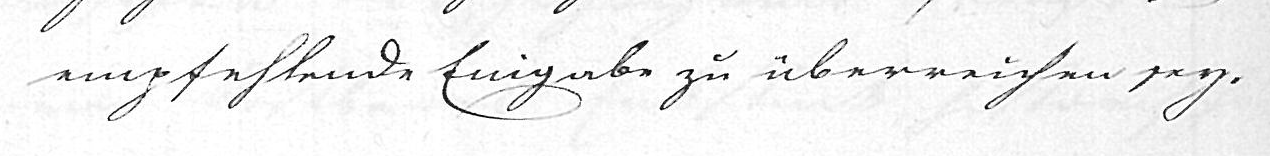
empfehlende Eingabe zu überreichen sey.
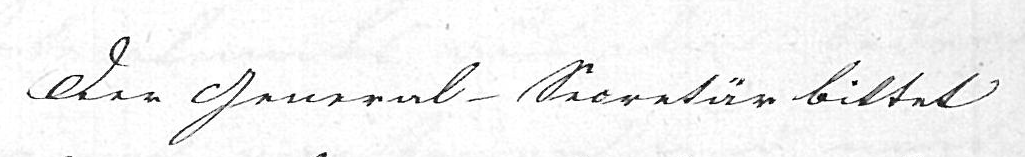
Der General-Secretär bittet
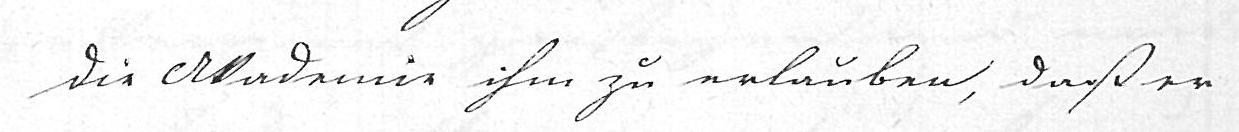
die Akademie ihm zu erlauben, daß er
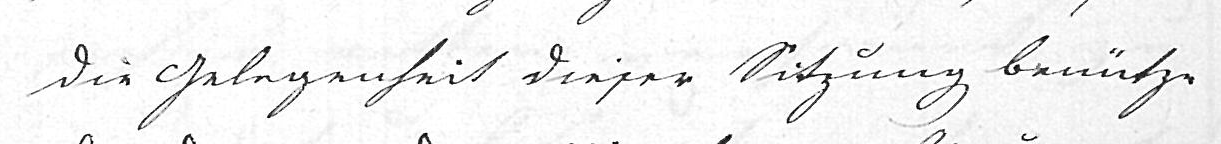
die Gelegenheit dieser Sitzung benütze
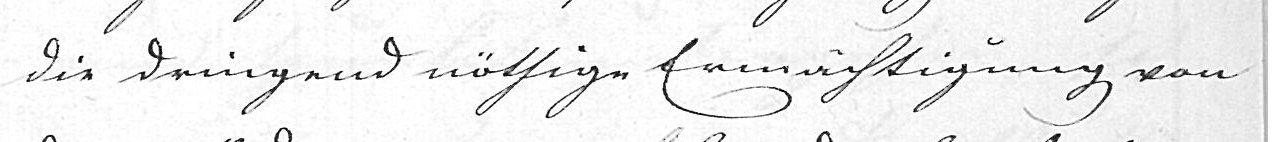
die dringend nöthige Ermächtigung von
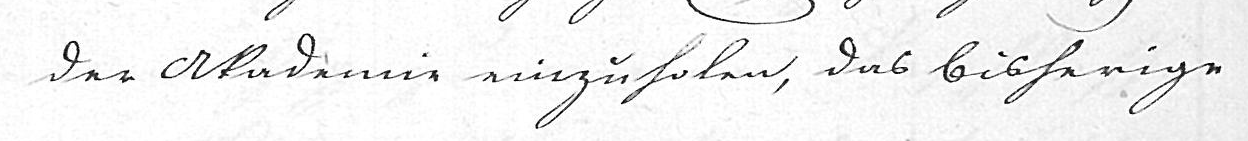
der Akademie einzuholen, das bisherige
